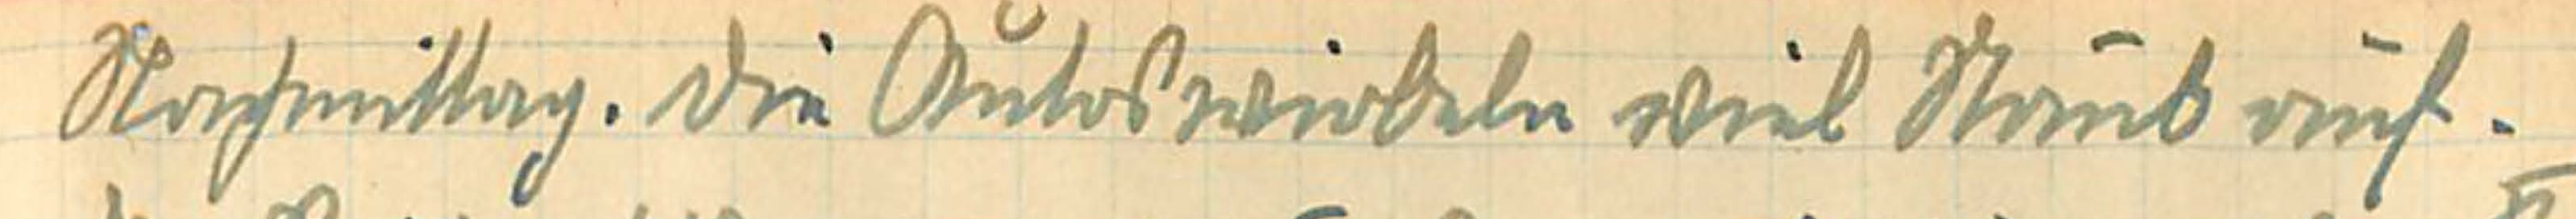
Nachmittag. Die Autos wirbeln viel Staub auf.
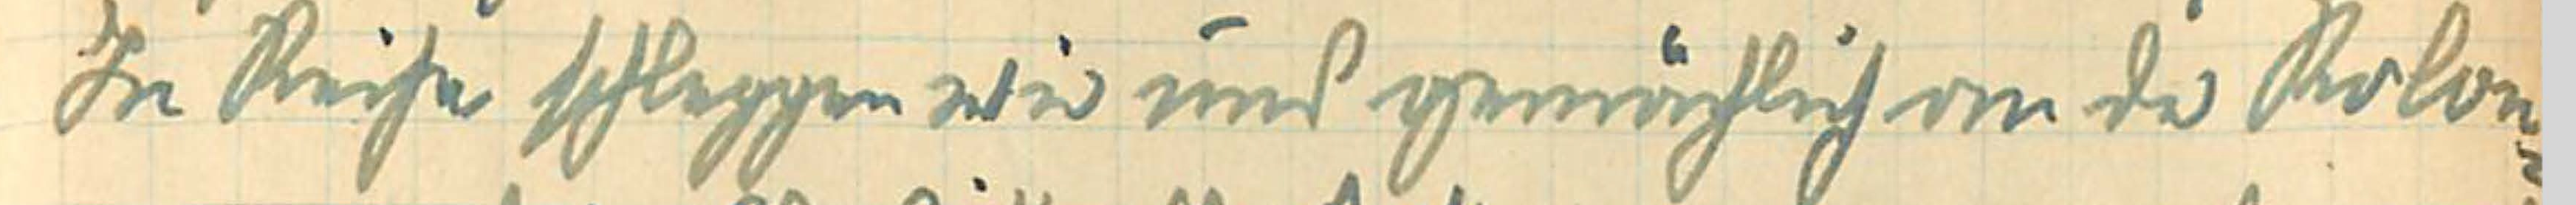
In Reihe schleppen wir uns gemächlich an der Kolon-
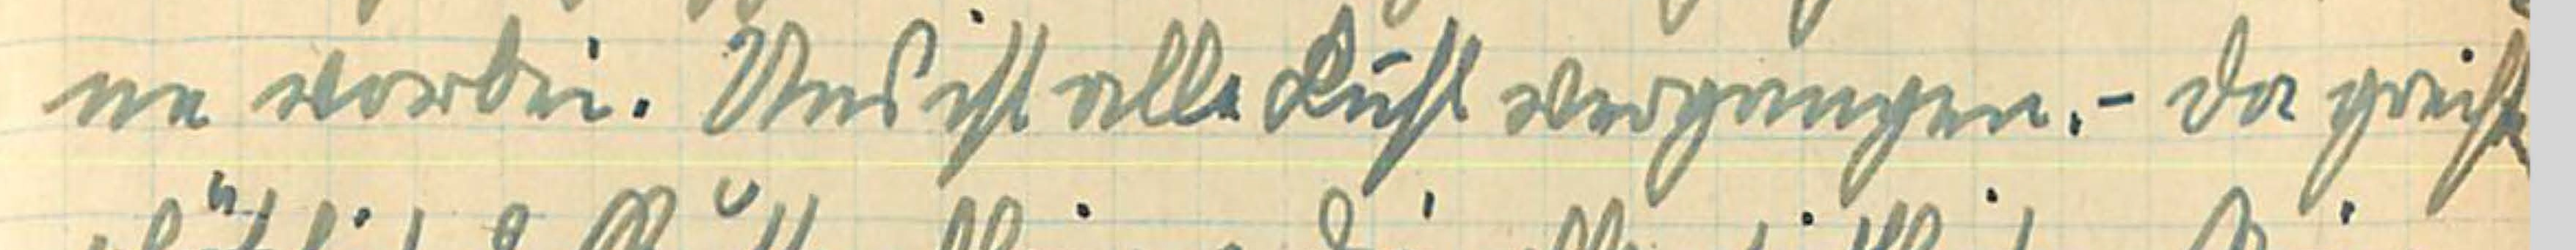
ne vorbei. Uns ist alle Lust vergangen. – Da greifen
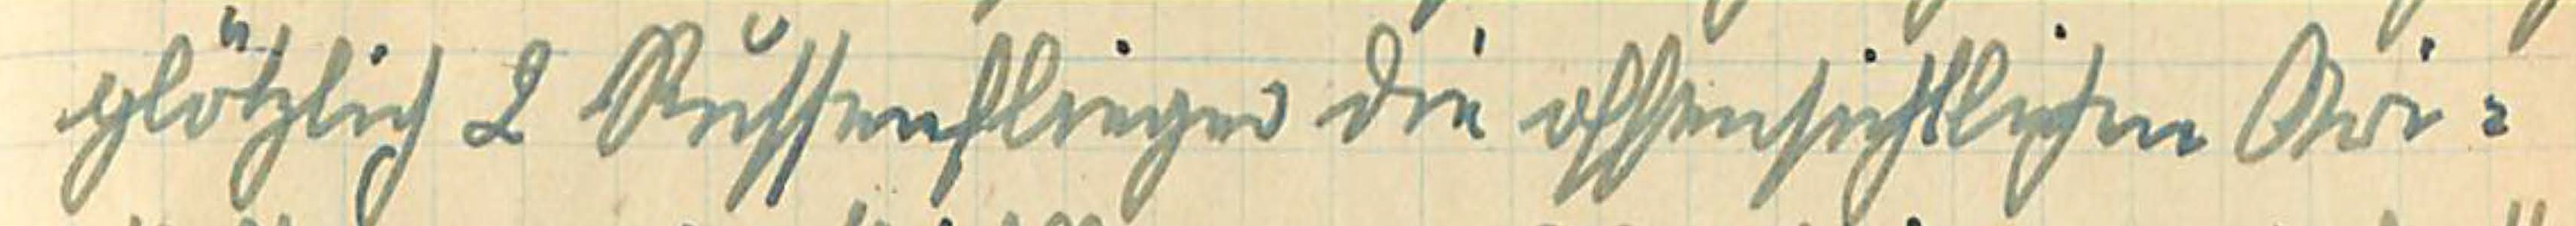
plötzlich 2 Russenflieger die offensichtlichen Ari-
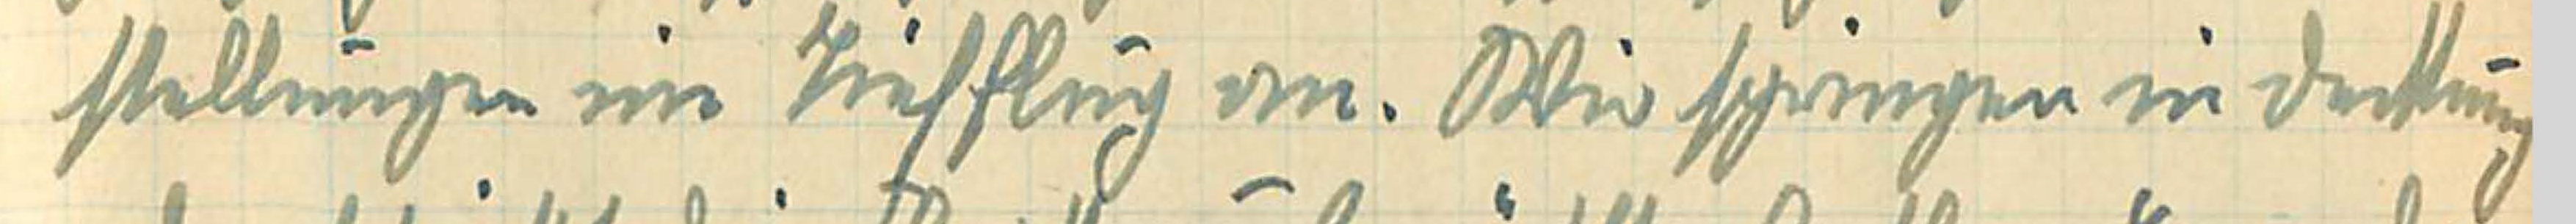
stellungen im Tiefflug an. Wir springen in Deckung.
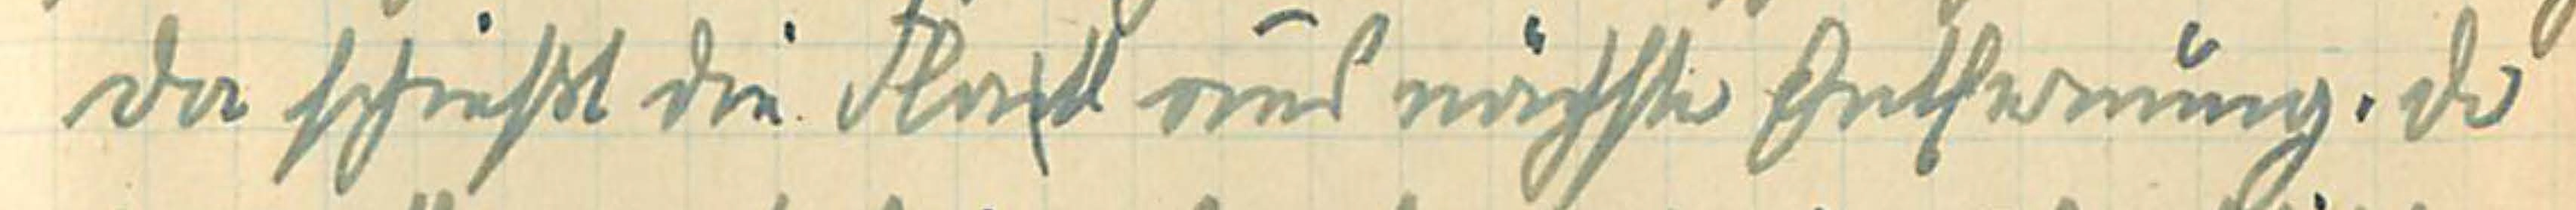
Da schießt die Flack aus nächster Entfernung. Der
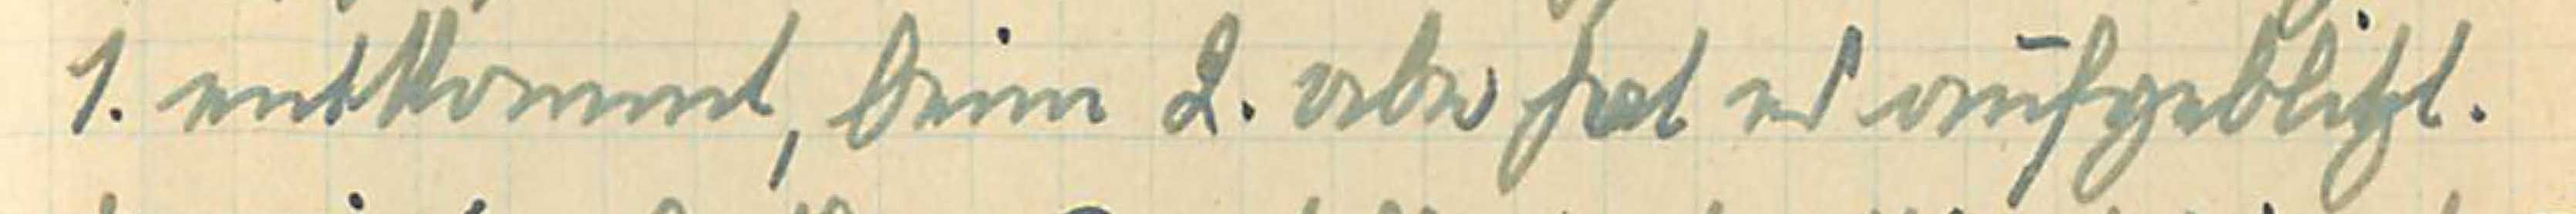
1. entkommt, beim 2. aber hat es aufgeblitzt.
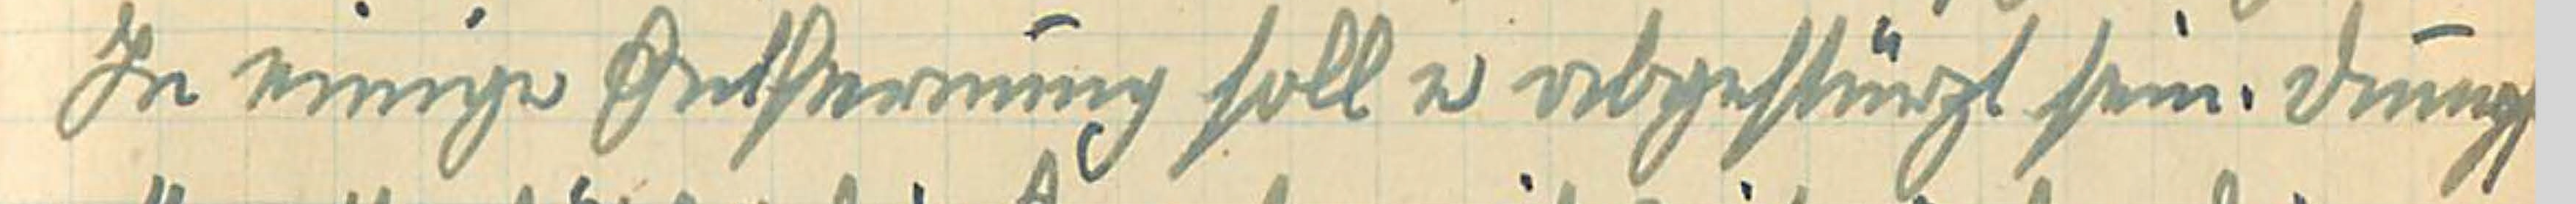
In einiger Entfernung soll er abgestürzt sein. Dumpf
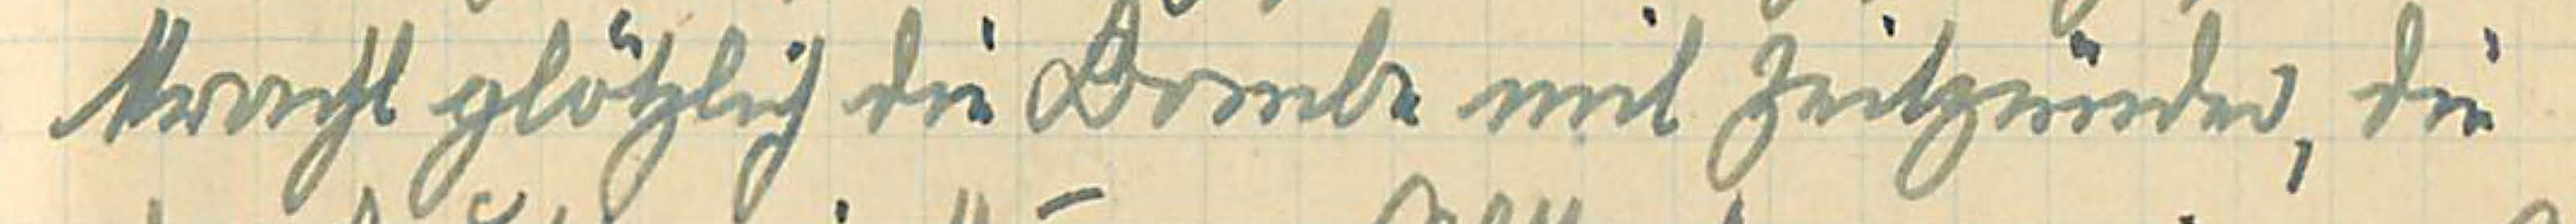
kracht plötzlich die Bombe mit Zeitzünder, die
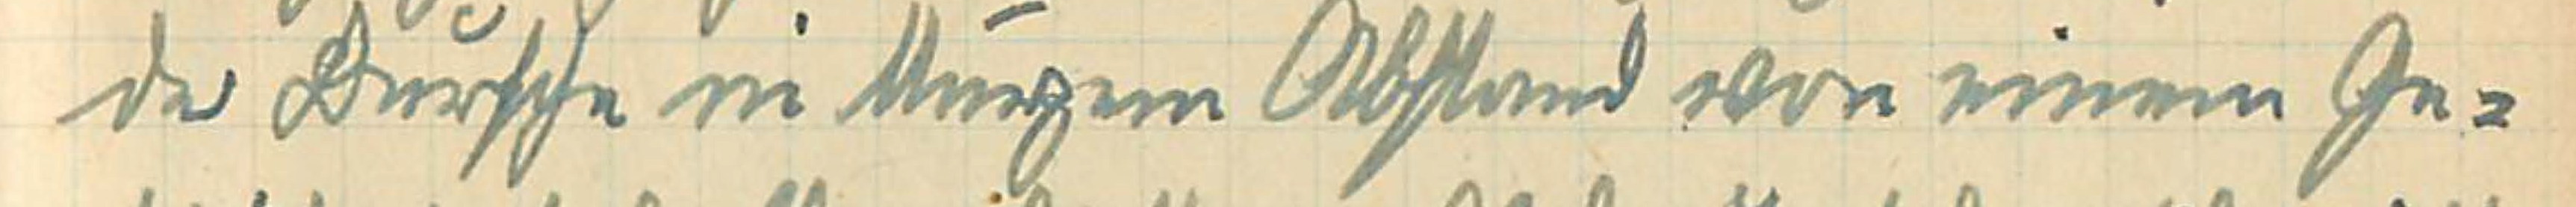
der Bursche in kurzem Abstand von einem Ge-
